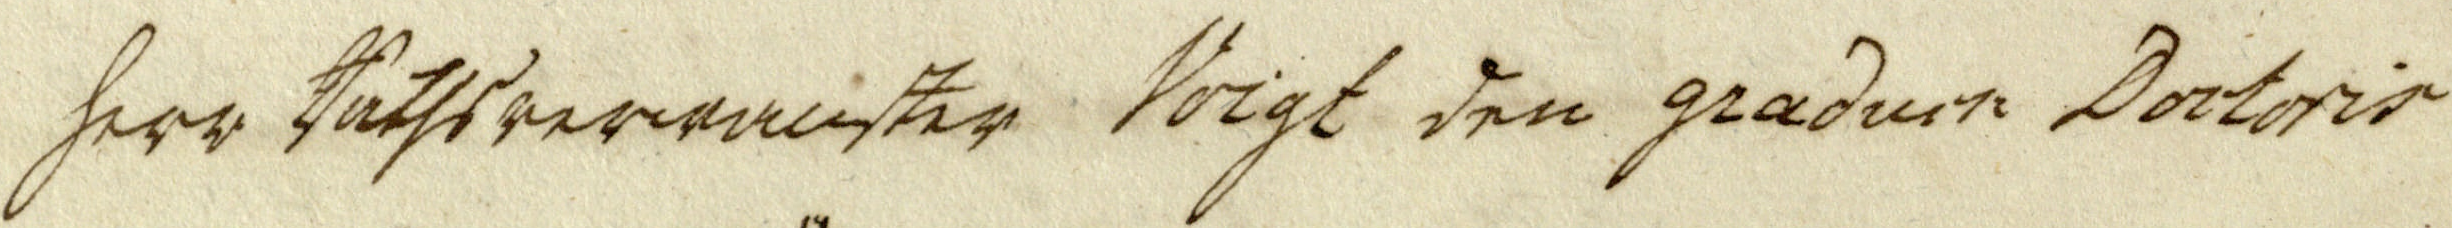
herr Rathsverwandter Voigt den gradum Doctoris
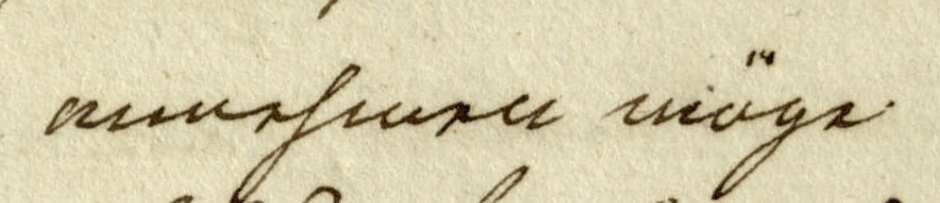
annehmen möge.
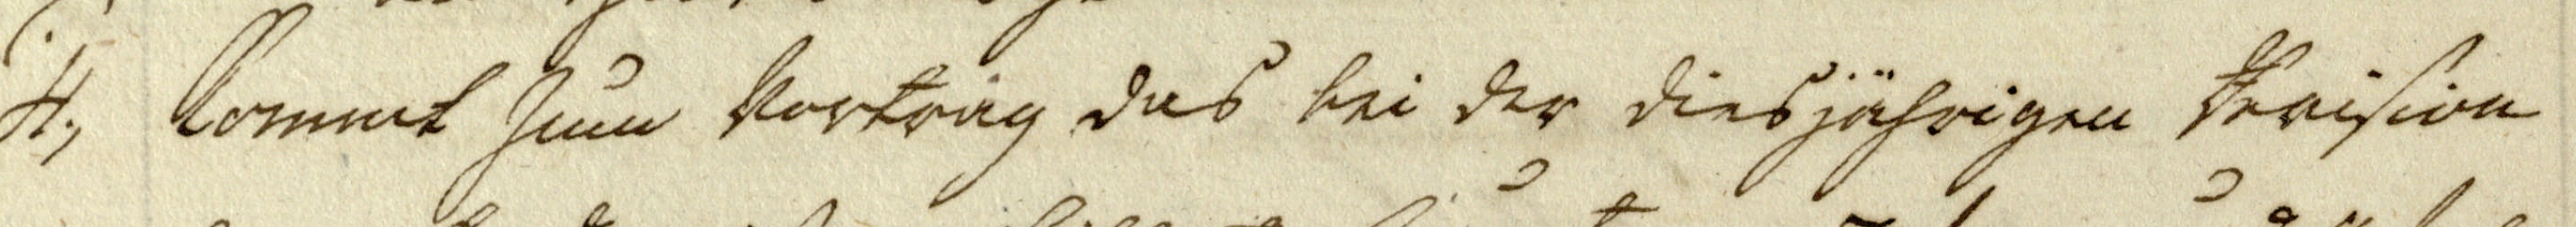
4., Kommt zum Vortrag das bei der diesjährigen Revision
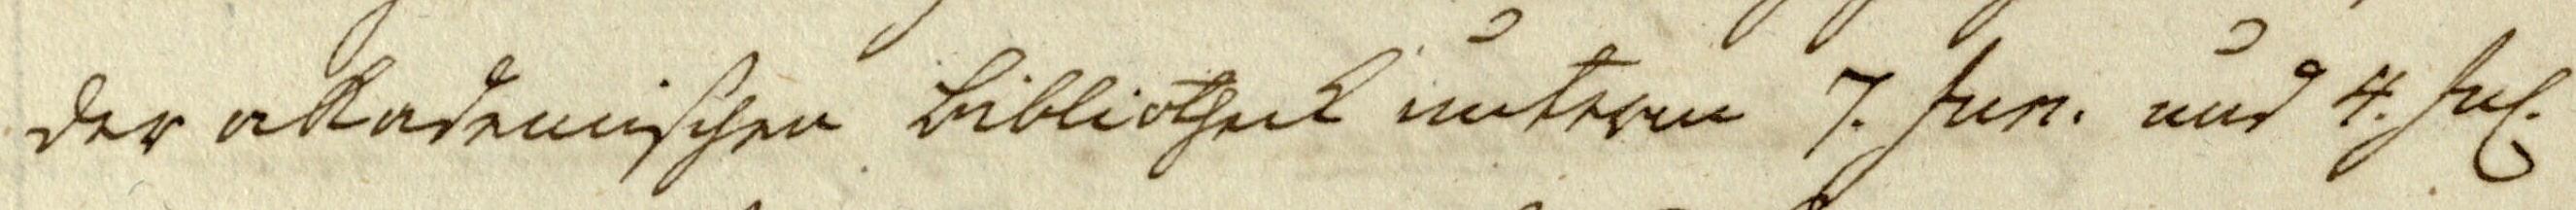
der akademischen Bibliotheck unterm 7. Jun. und 4. Jul.
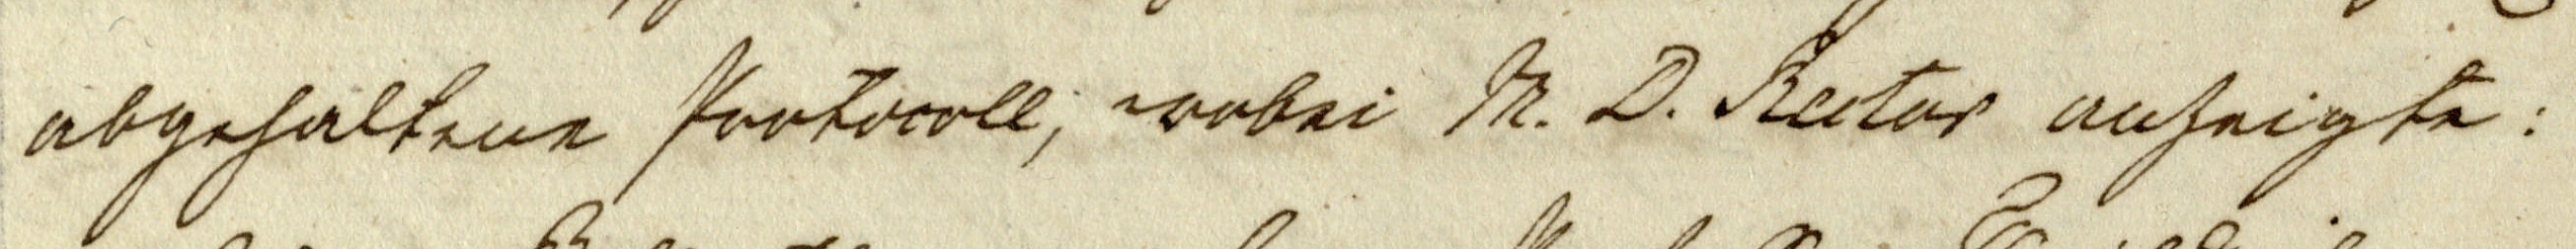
abgehaltene Protocoll, wobei M. D. Rector anzeigte:
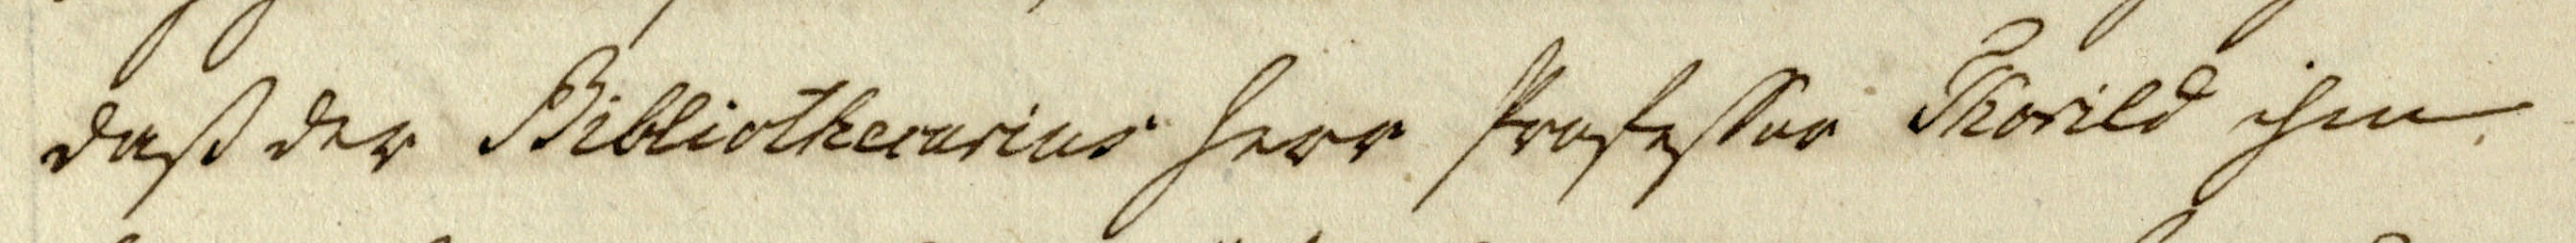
daß der Bibliothecarius herr Professor Thorild ihm
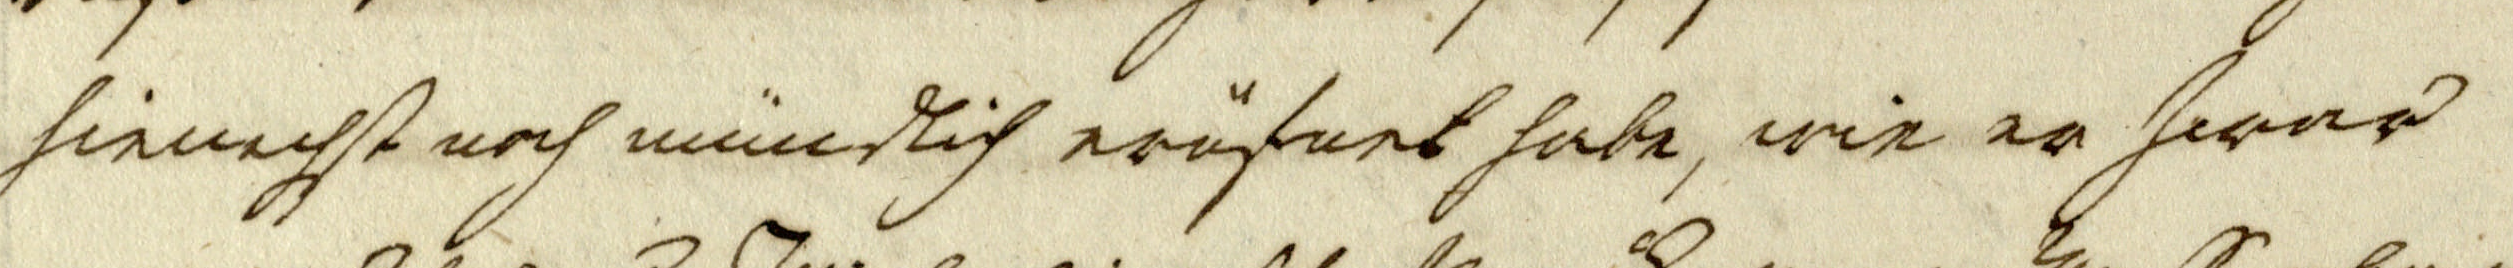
hienechst noch mündlich eröfnet habe, wie er zwar
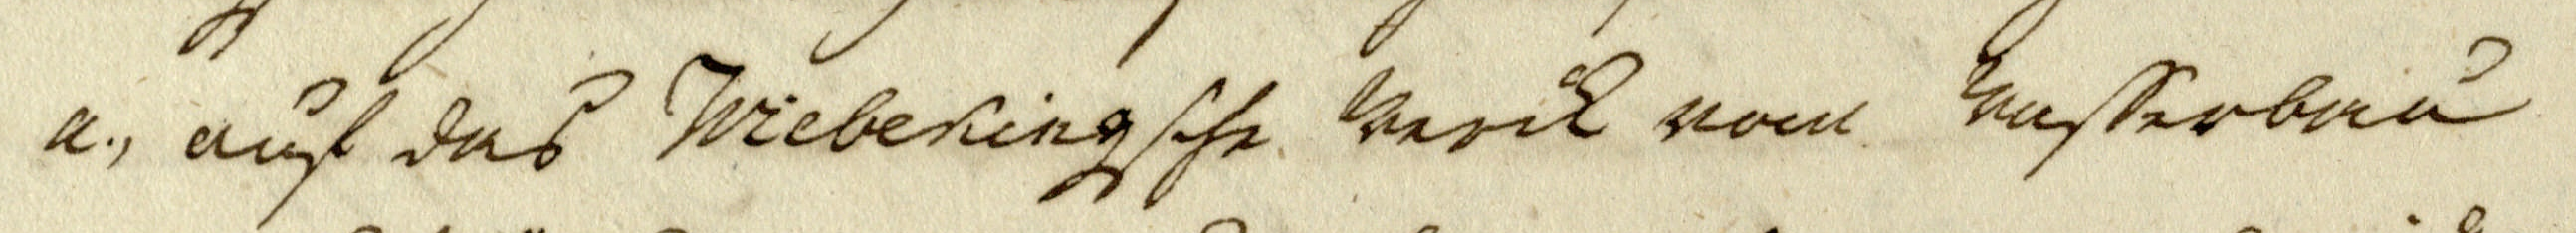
a., auf das Wiebekingsche Werck vom Wasserbau
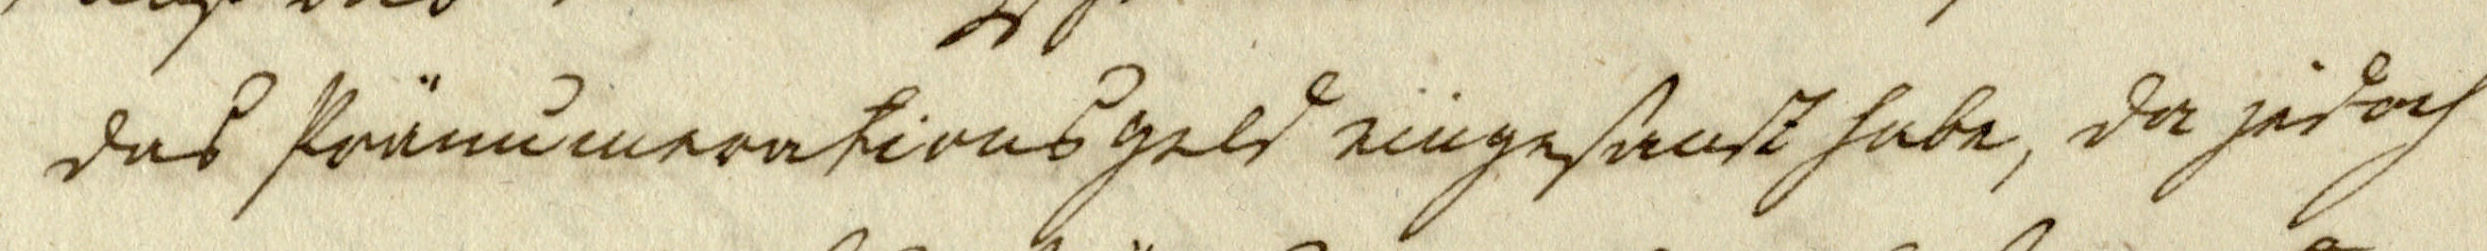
das Pränumerationsgeld eingesandt habe, da jedoch
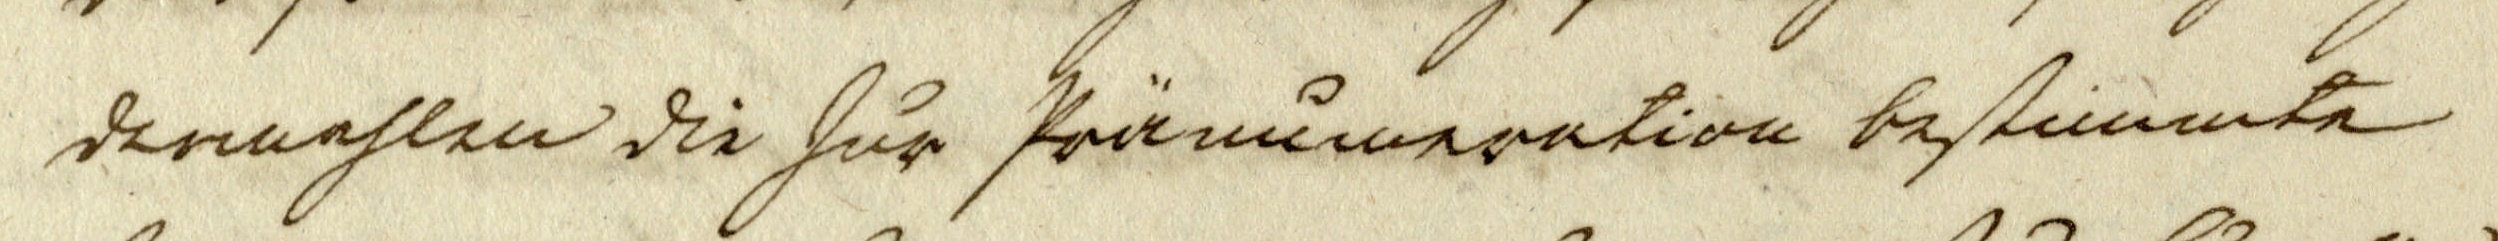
dermahlen die zur Pränumeration bestimmte
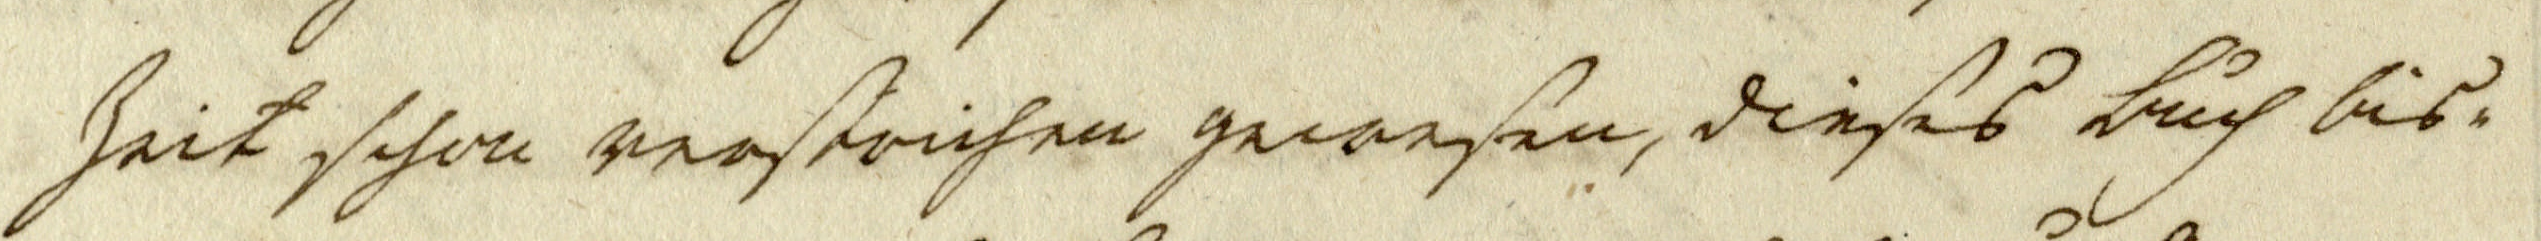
Zeit schon verstrichen gewesen, dieses Buch bis¬
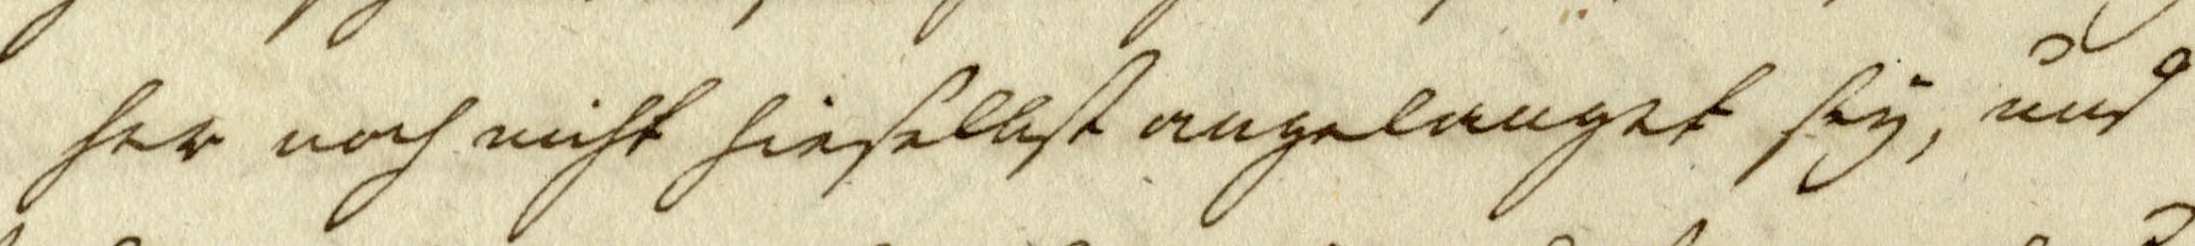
her noch nicht hieselbst angelanget seÿ, und
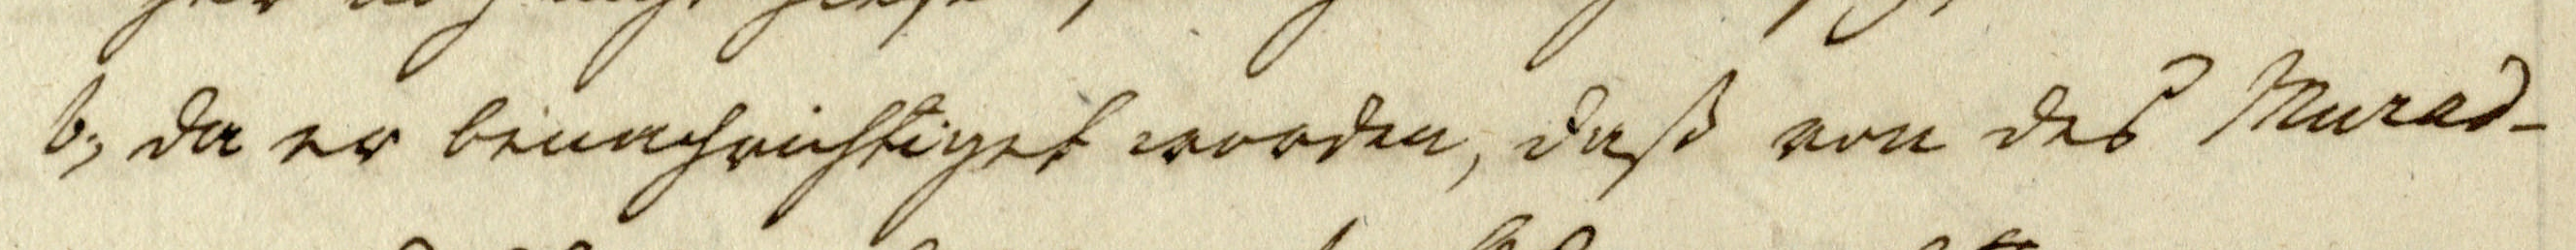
b., da er benachrichtiget worden, daß von des Murad¬
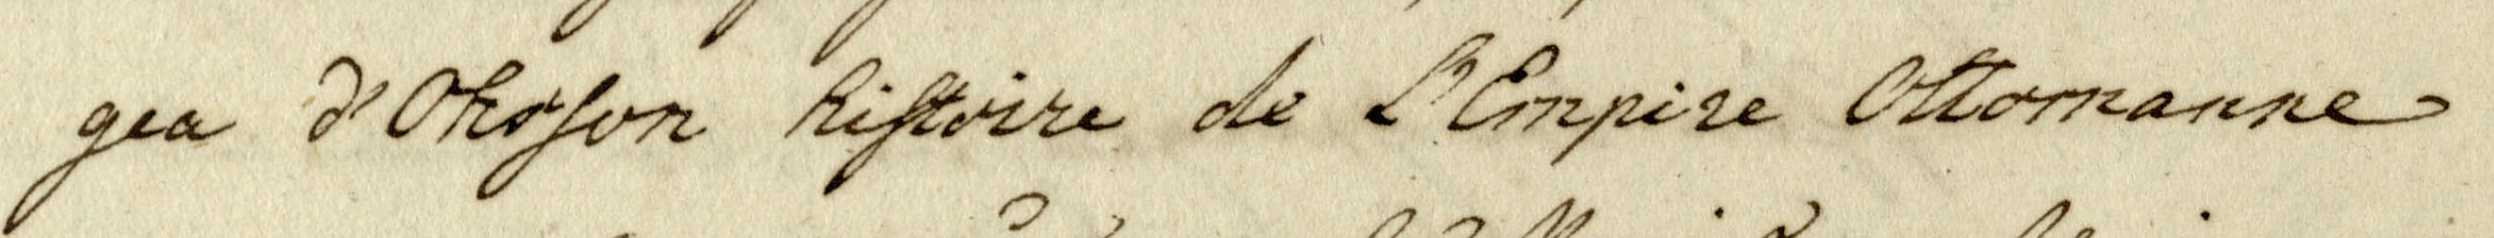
gea d Ohsson histoire de L Empire Ottomanne
